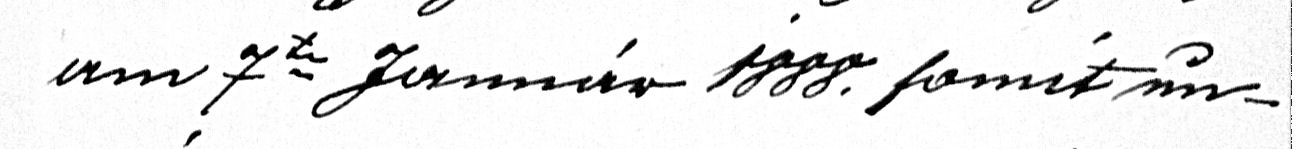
am 7ten Jannár 1888. somit un¬
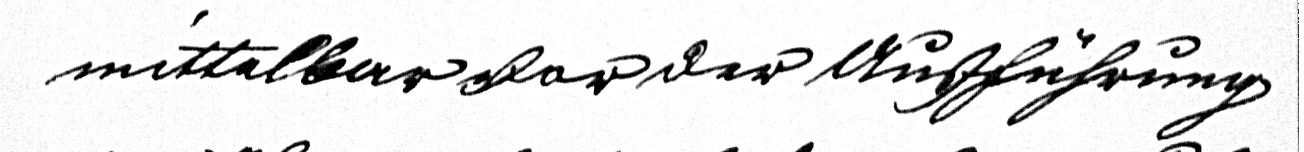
mittelbar vor der Ausführung
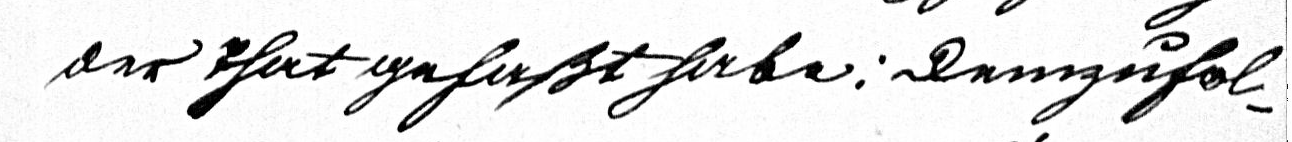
der That gefaßt habe: Demzufol¬
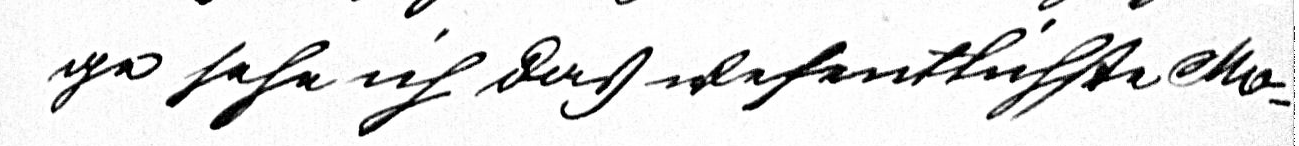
ge sehe ich das wesentlichste Mo¬
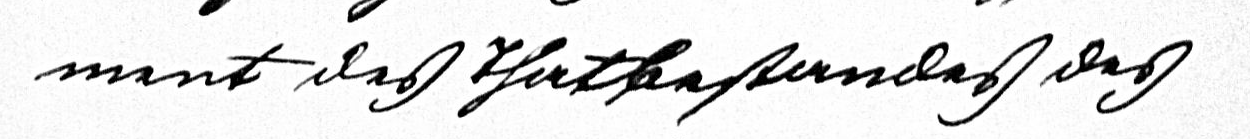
ment des Thatbestandes des
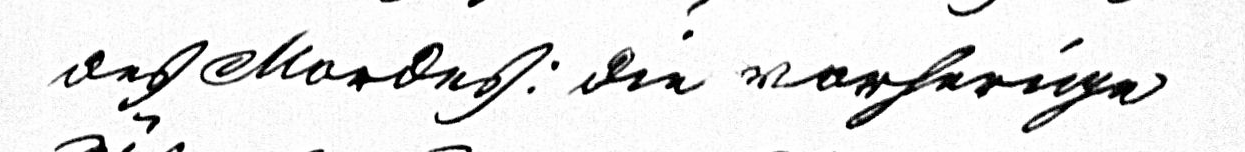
des Mordes: die vorherige
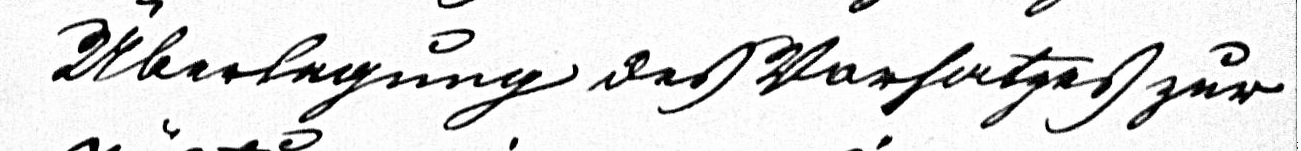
Überlegung des Vorsatzes zur
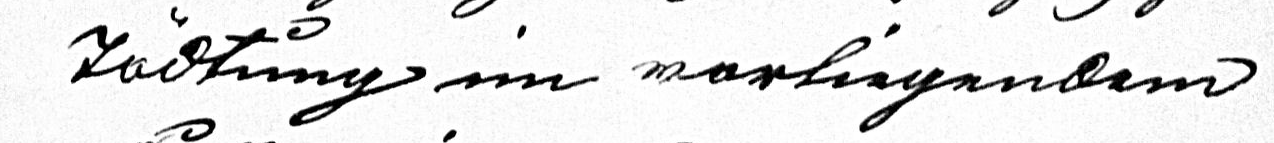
Tödtung im vorliegendem
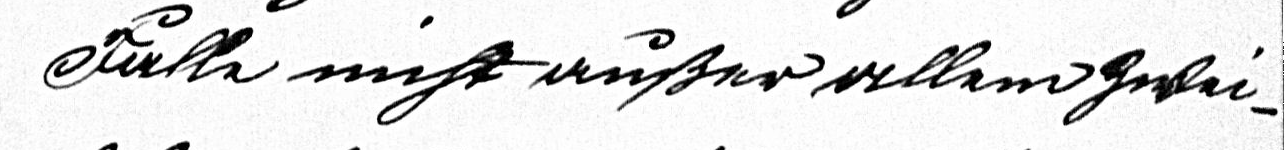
Falle nicht außer allen Zwei¬
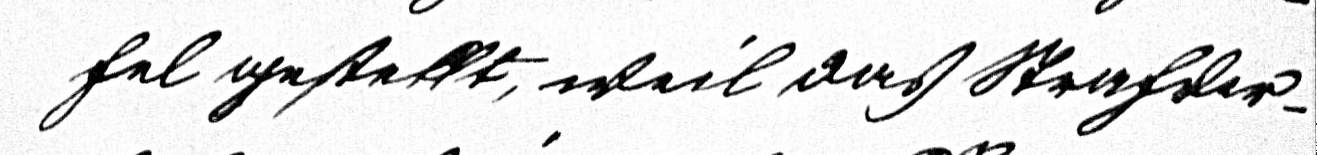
fel gestellt, weil das Strafver¬
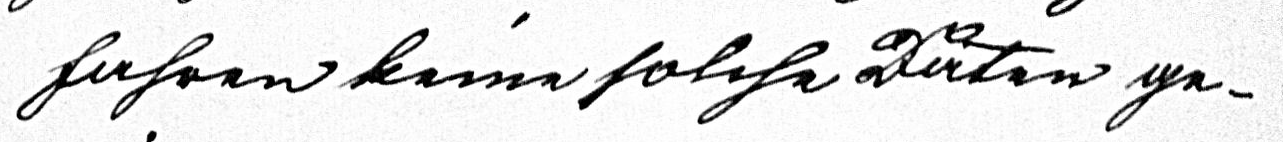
fahren keine solche Daten ge¬
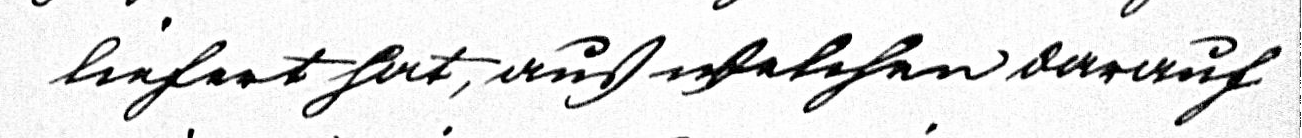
liefert hat, aus welchen darauf
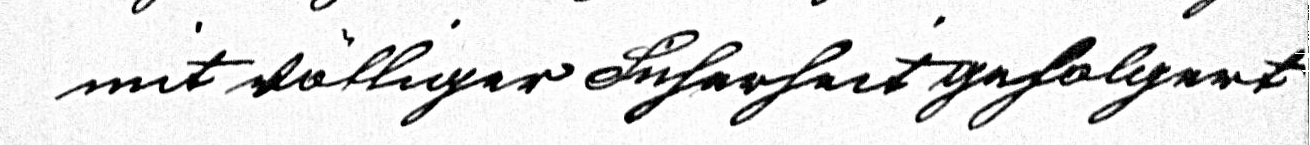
mit völliger Sicherheit gefolgert
